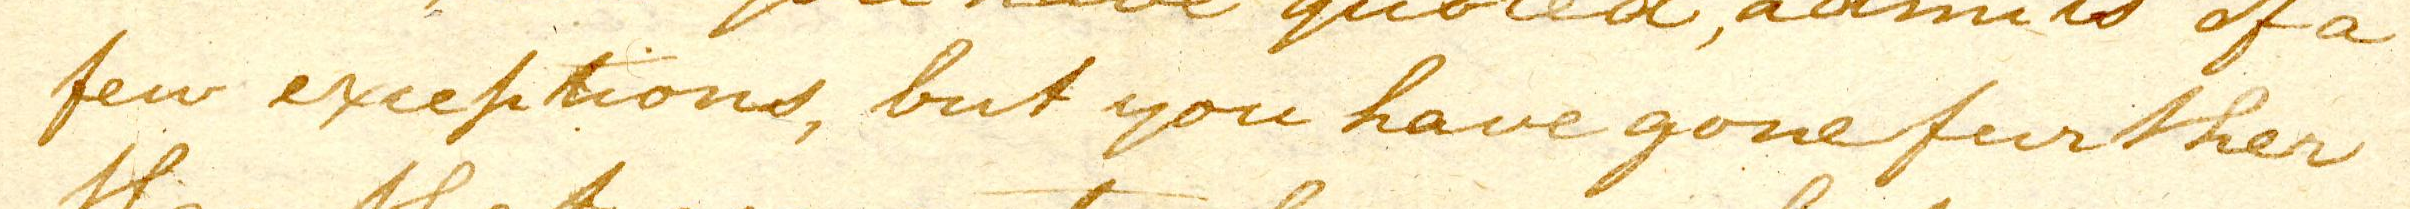few exceptions, but you have gone further
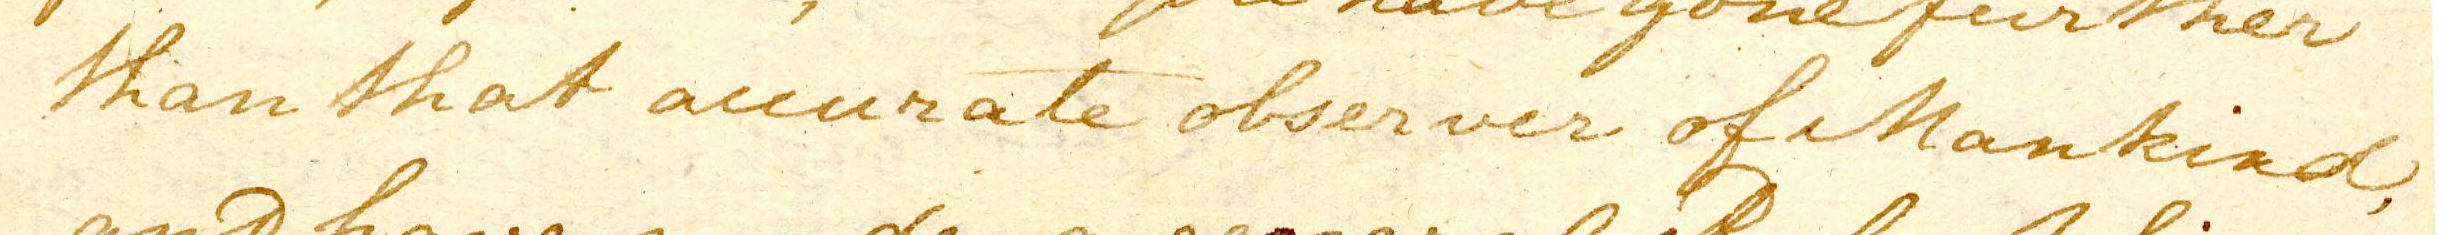than that accurate observer of Mankind,
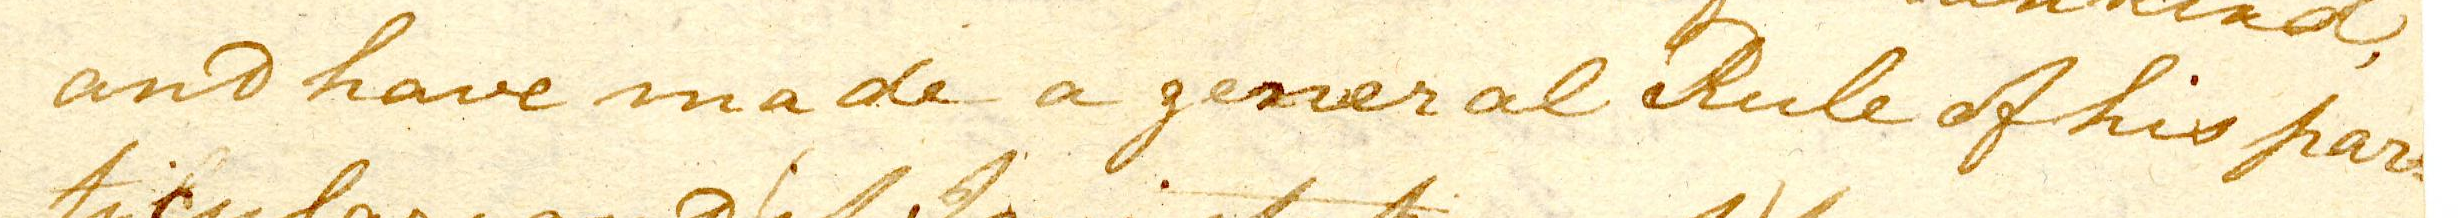and have made a general Rule of his par-
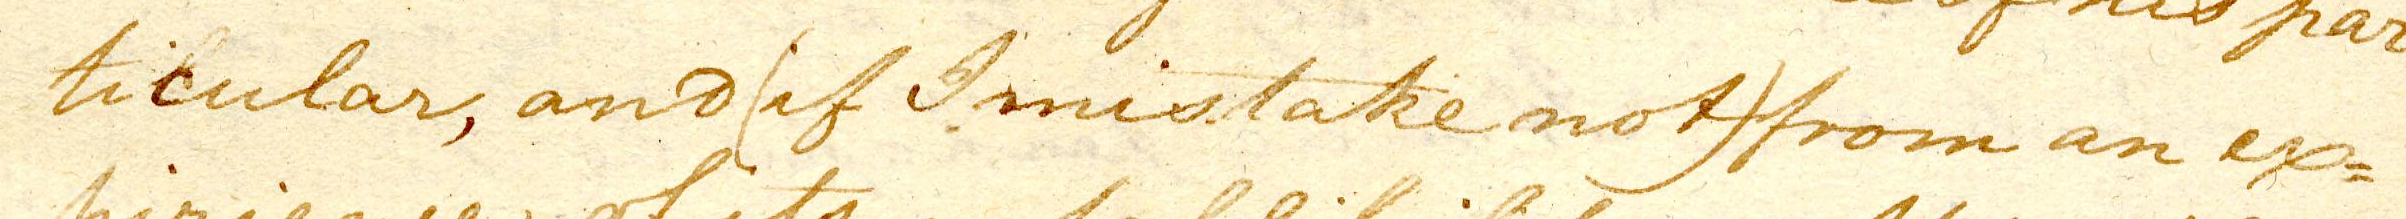ticular, and (if I mistake not) from an ex-
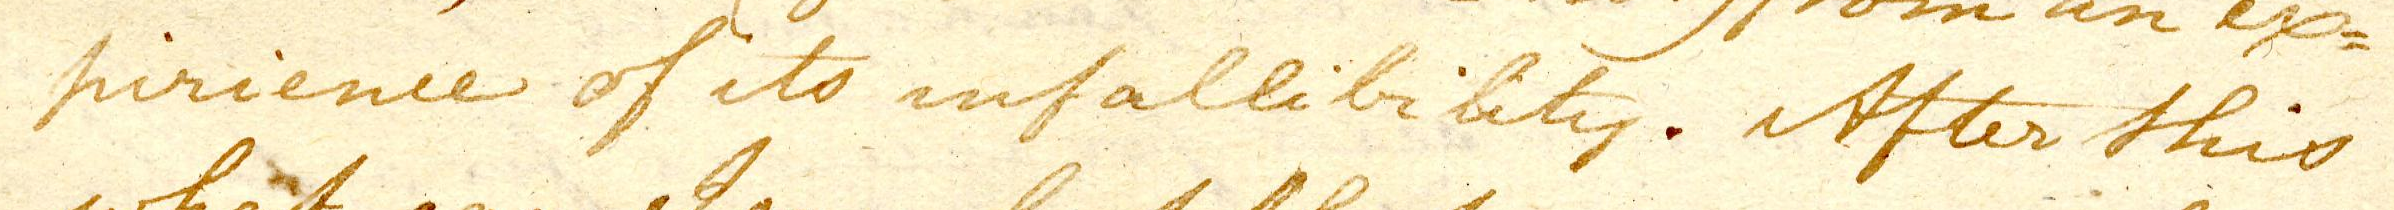pirience of its infallibility. After this
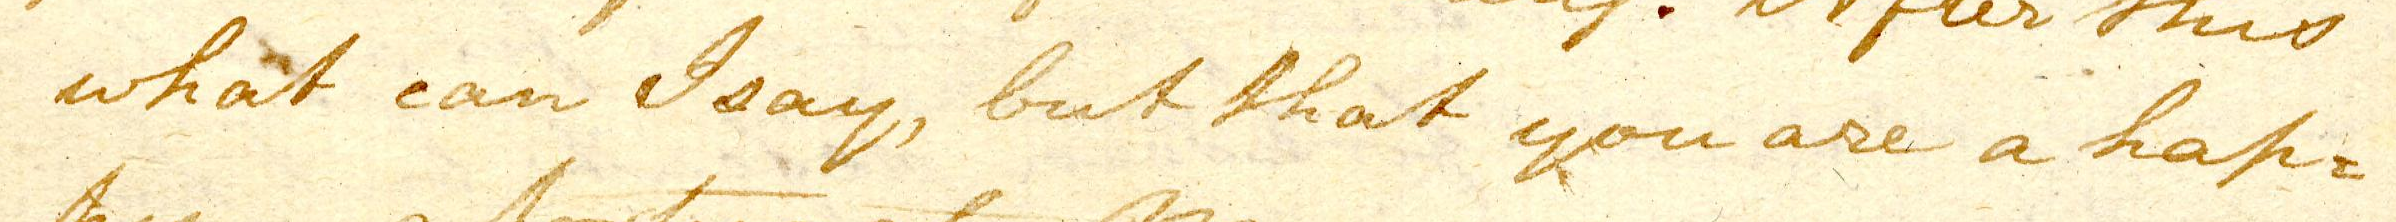what can I say, but that you are a hap-
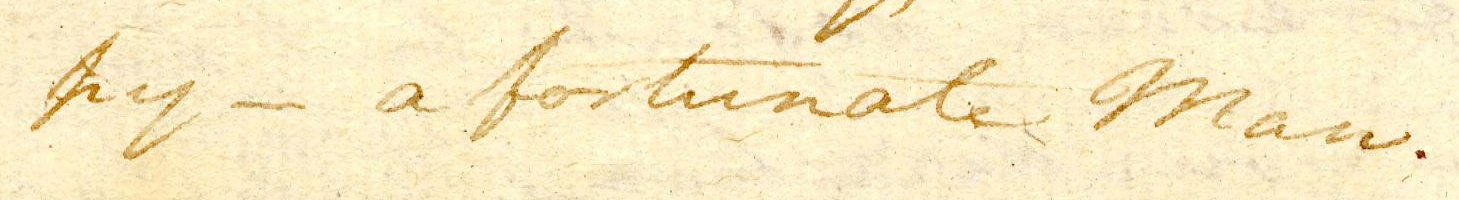py-a fortunate Man.
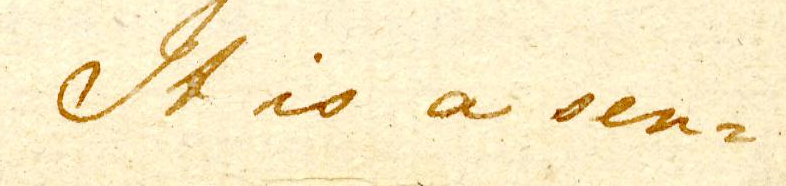It is a sen-
